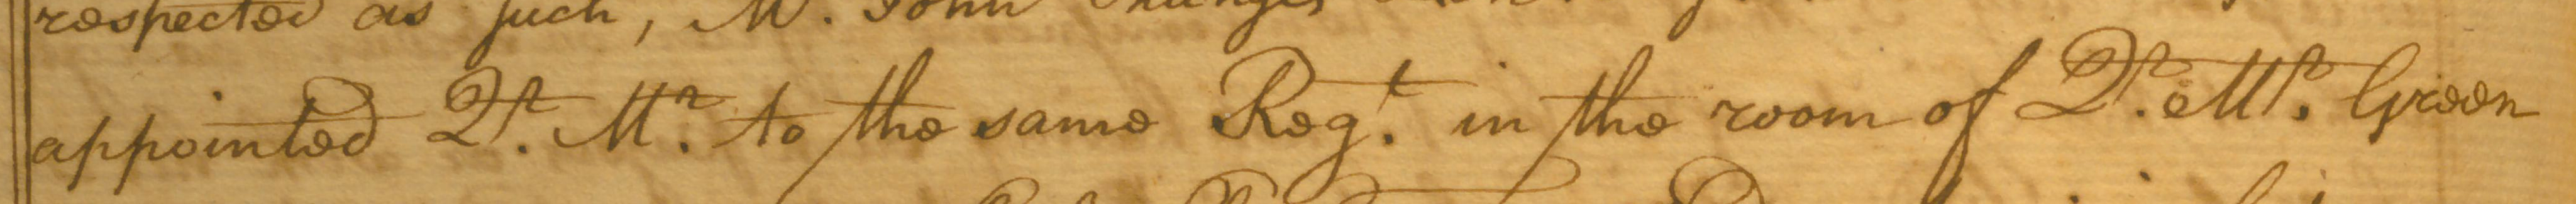appointed Q^r. M^r. to the same Reg^t. in the room f Q^r. M^r. Green
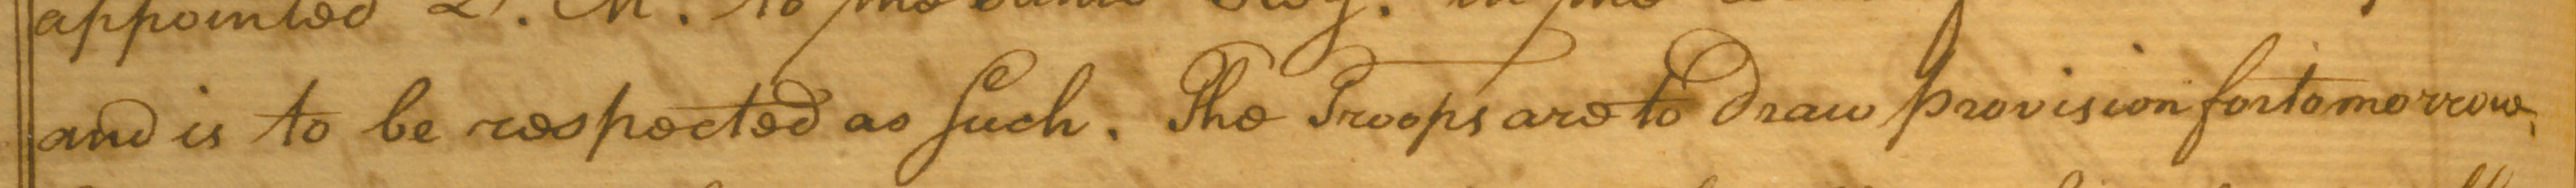and is to be respected as such. The Troops are to draw provisions for tomorrow.
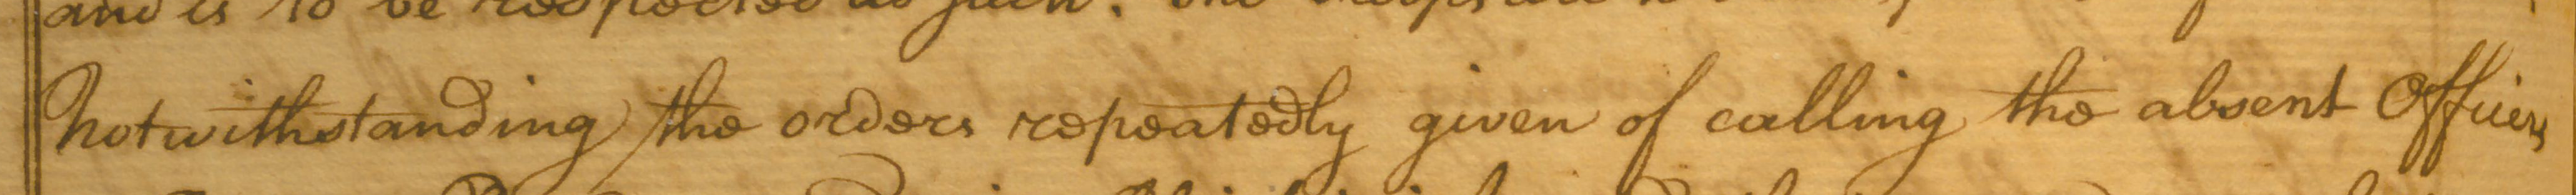Notwithstanding the orders repeatedly given of calling the absent Officers
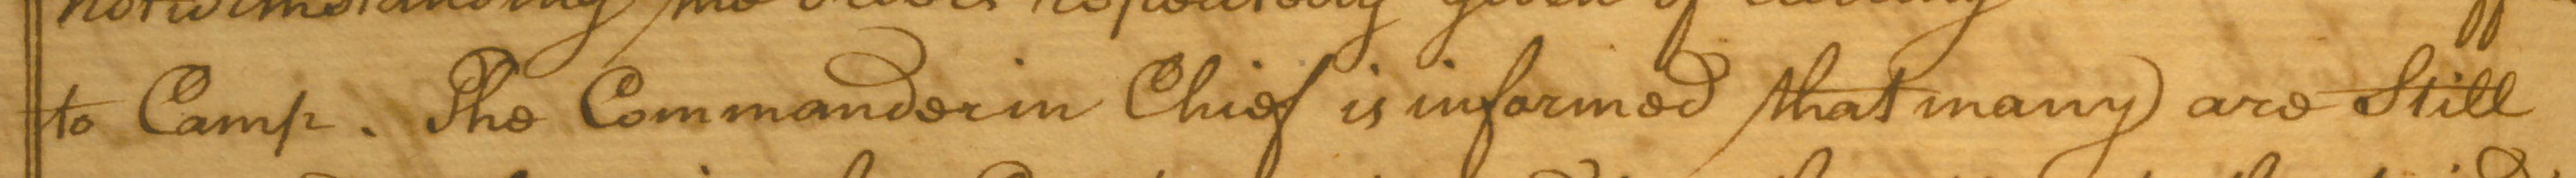to Camp. The Commander in Chief is informed that many are Still
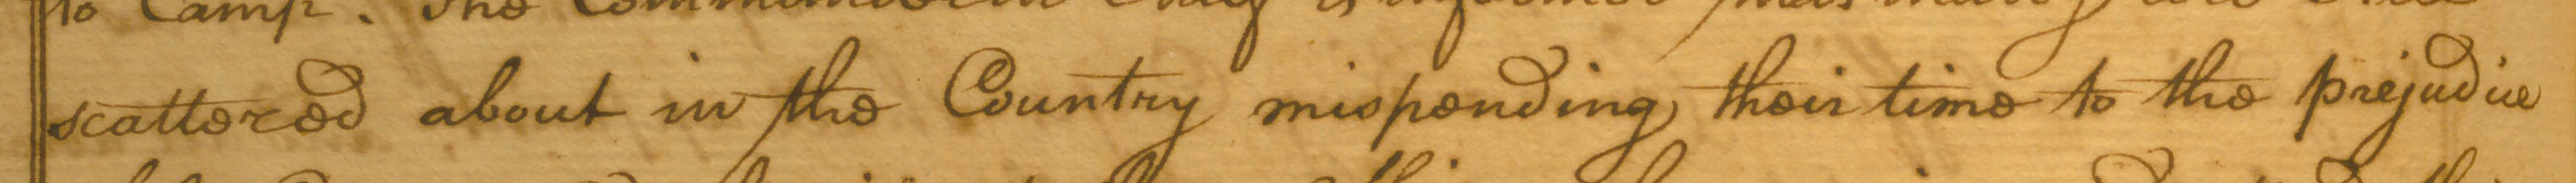scattered about in the Country mispending their time to the prejudice
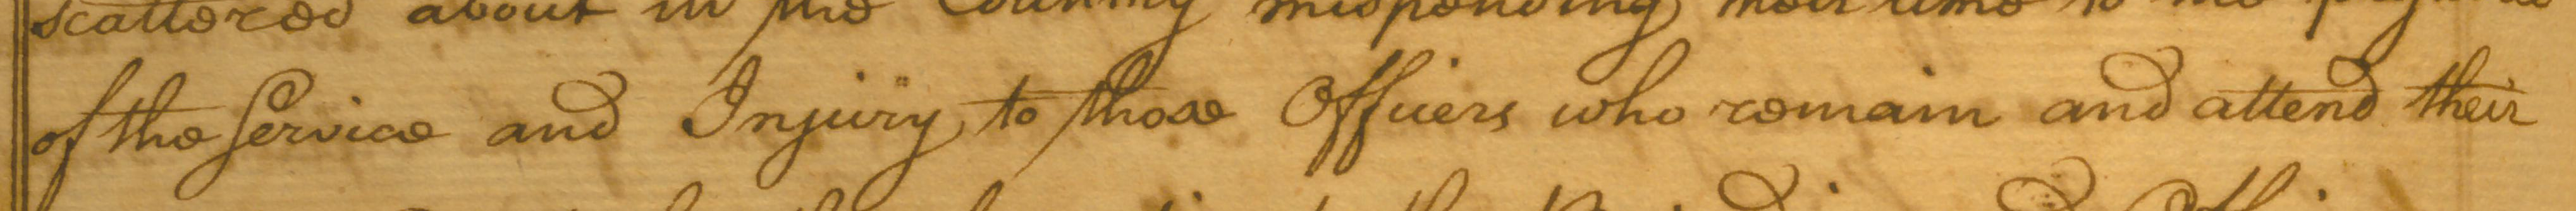of the Service and Injury to those Officers who remain and attend their
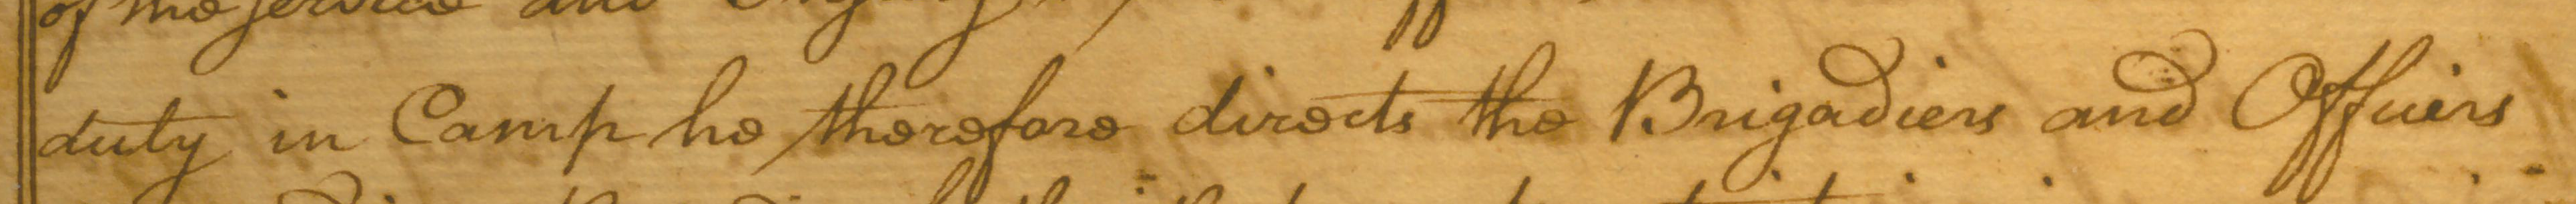duty in Camp he therefore directs the Brigadiers and Officers
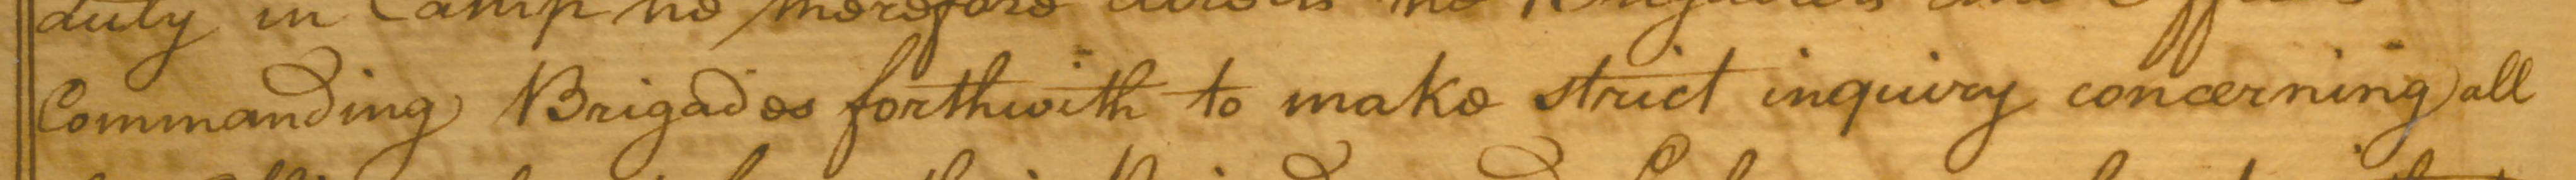Commanding Brigades forthwith to make strict inquiry concerning all
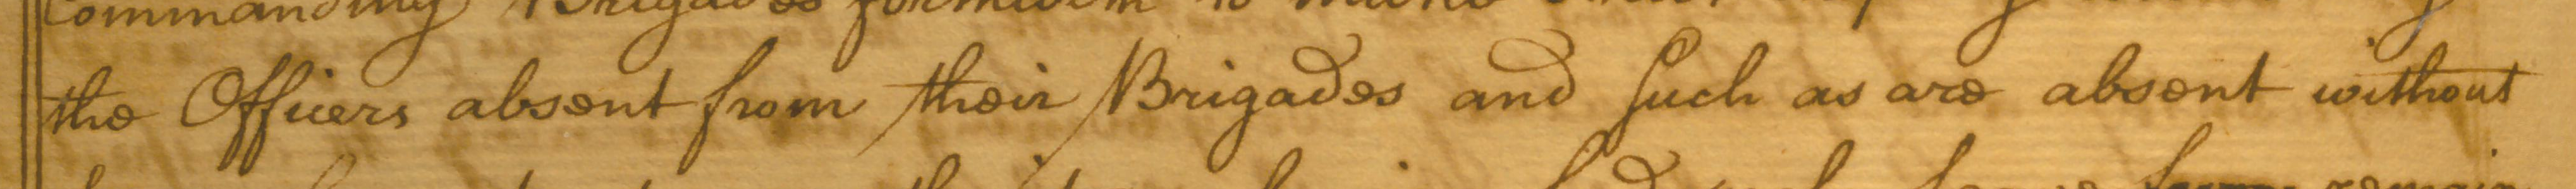the Officers absent from their Brigades and such as are absent without
